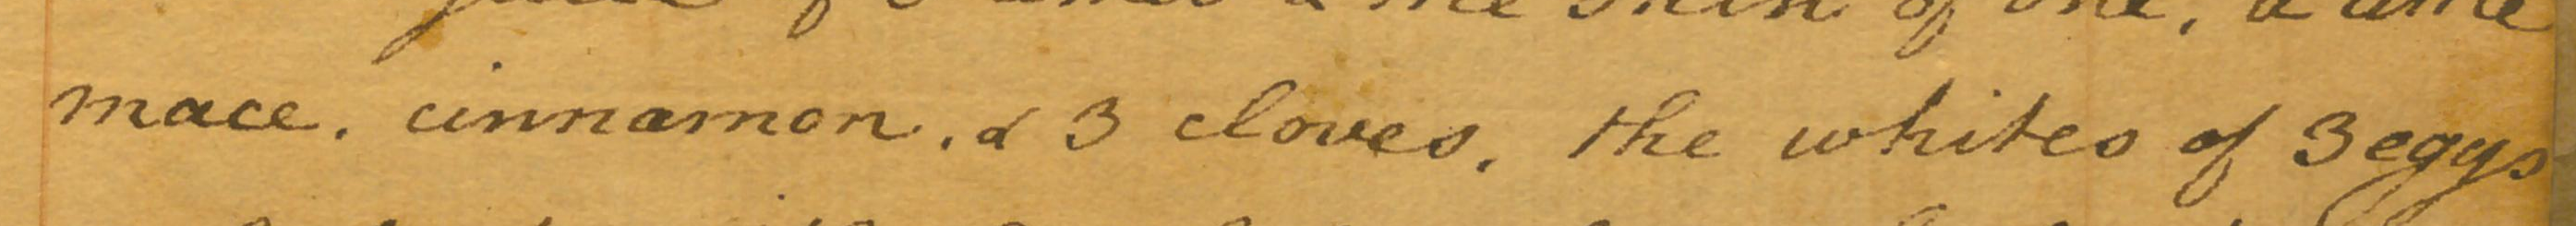mace, cinnamon, & 3 cloves, the whites of 3 eggs
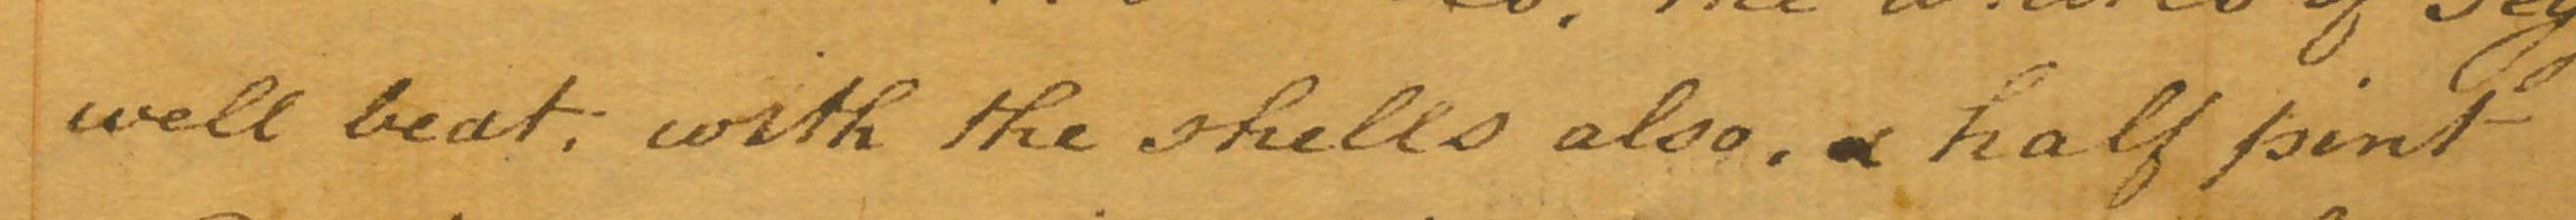well beat, with the shells also, & half pint
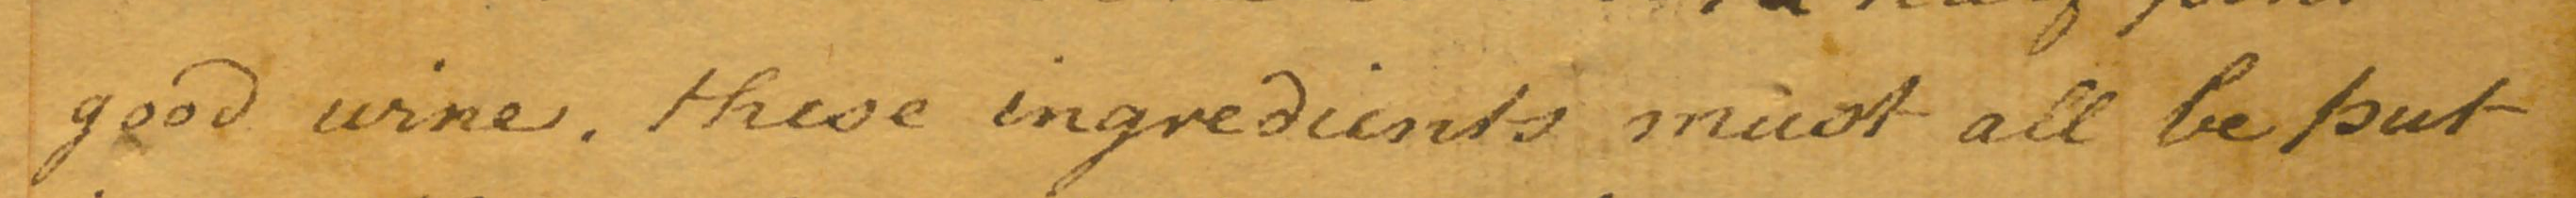good wine. these ingredients must all be put
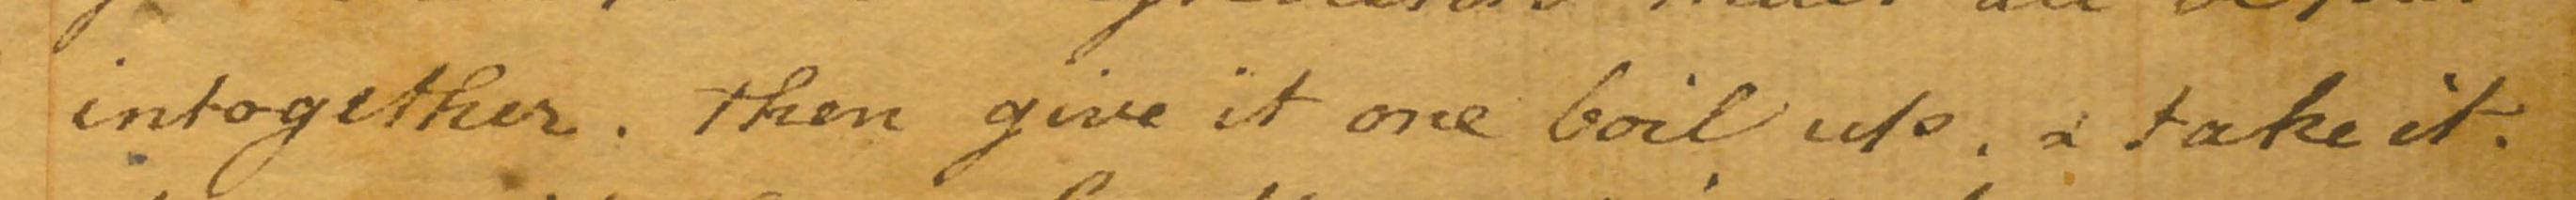intogether. then give it one boil up, & take it.
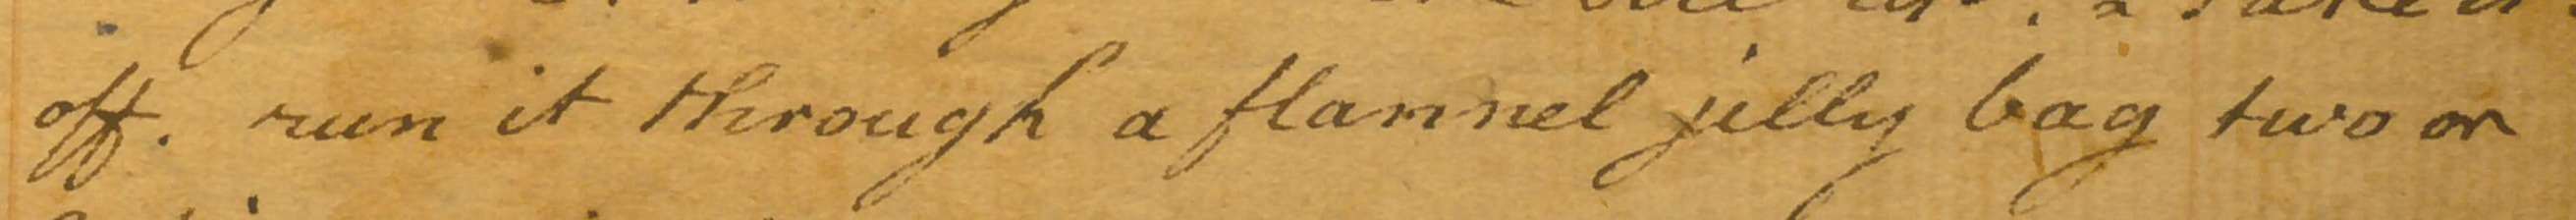off. run it rhgouh a flannel jelly bag two or
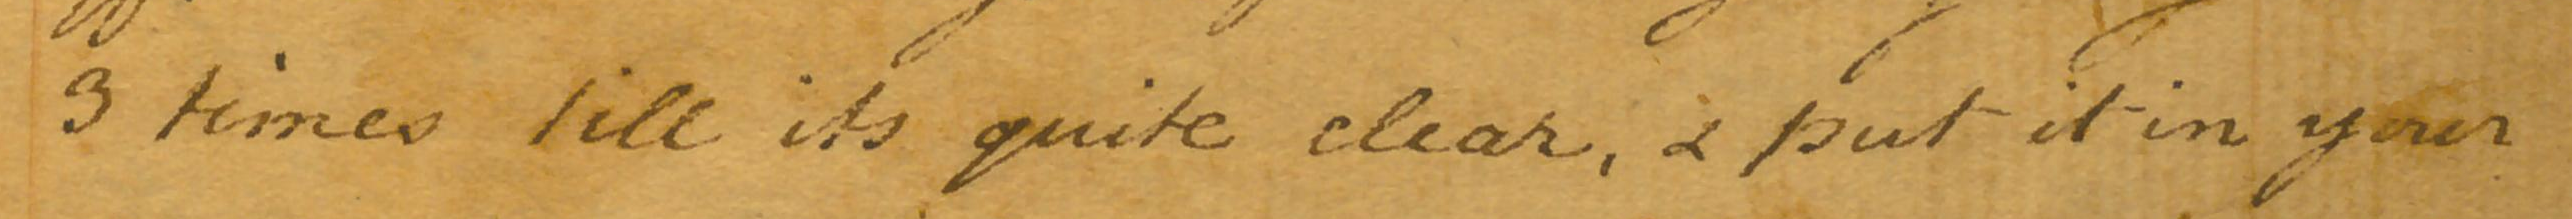3 times till its quite clear, & put it in your
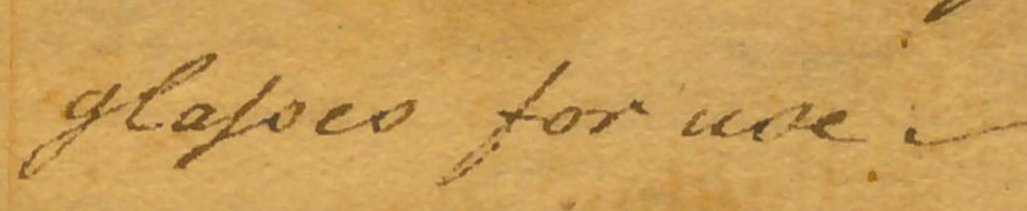glasses for use-
